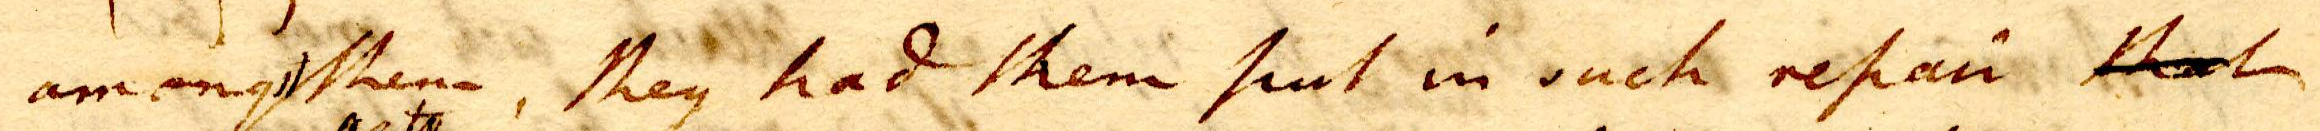amongst them, they had them put in such repair [that]
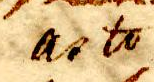as to
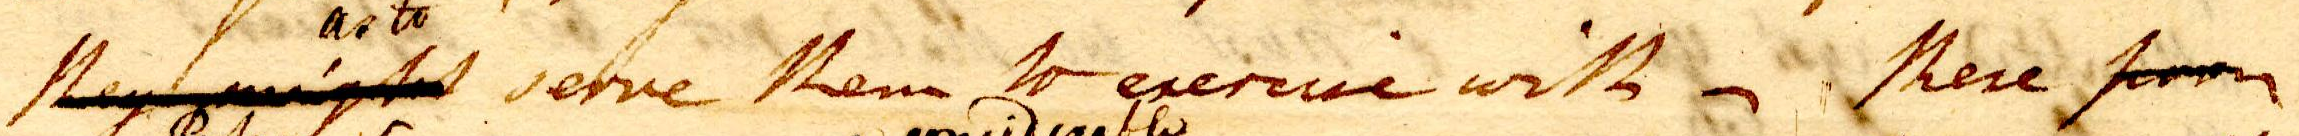[they might] ^ serve them to exercise with. these [from]
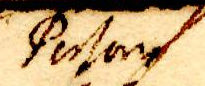Persons
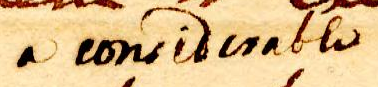a considerable
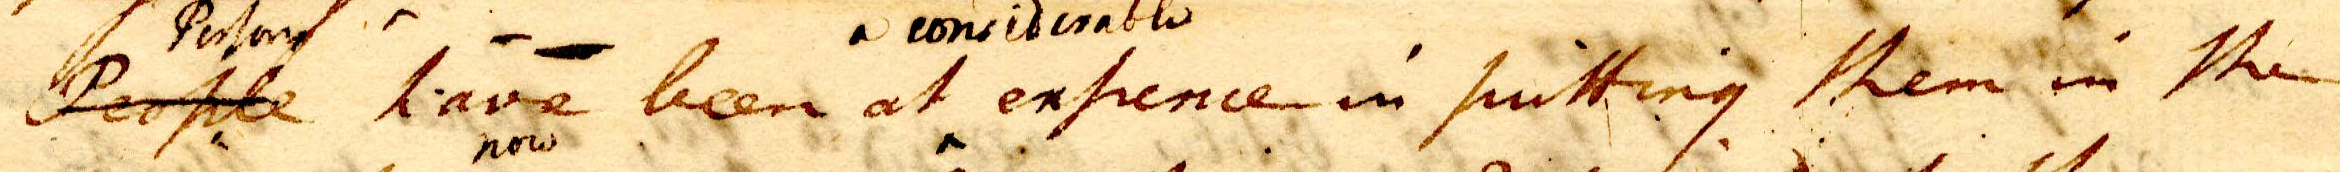[People] ^ have been at ^ expence in putting them in the
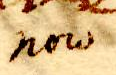now
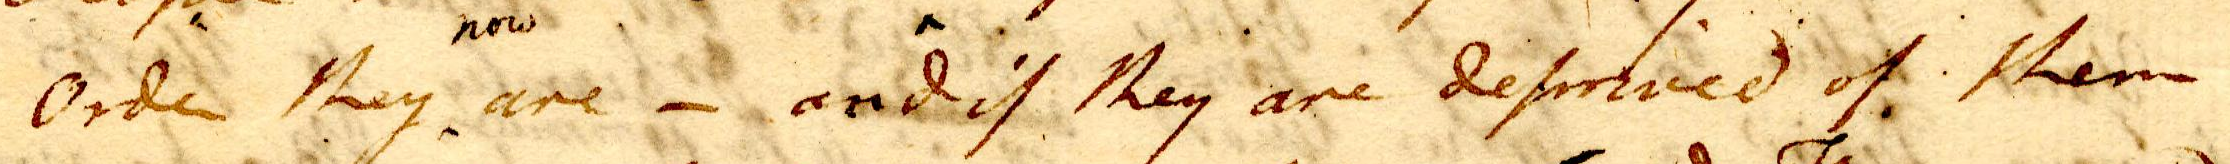order they ^ are, and if they are deprived of them
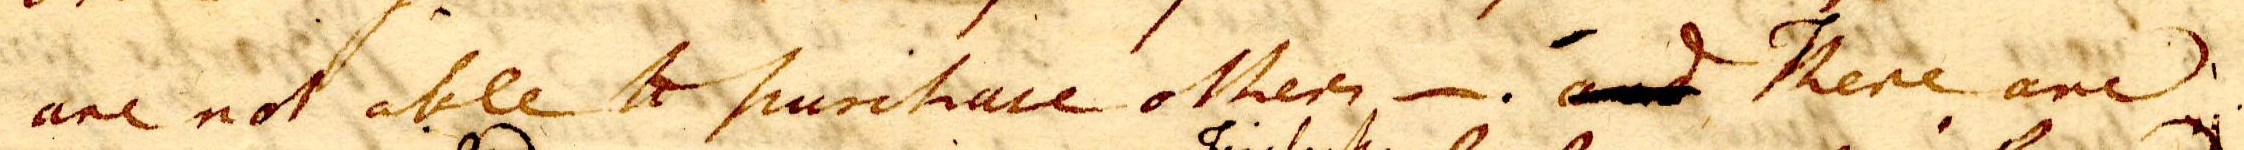are not able to purchase others. [and] There are
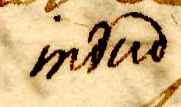indeed
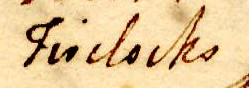Fisclocks
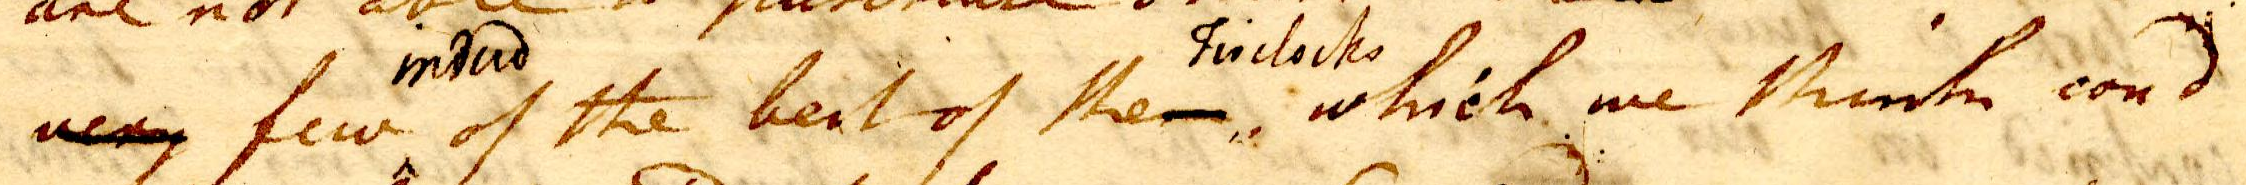[very] few ^ of the best of the ^ which we think cou'd
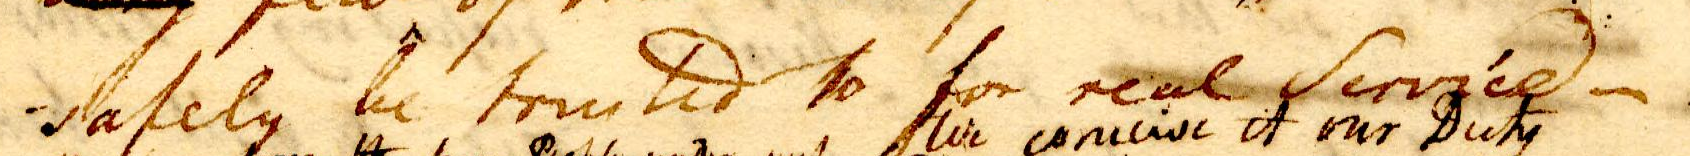safely be trusted to for real Service.
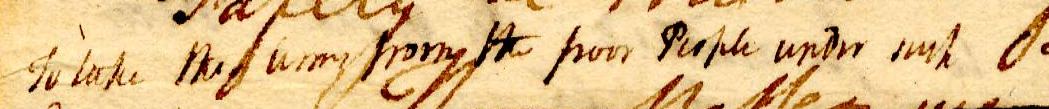To take the Army from the poor such
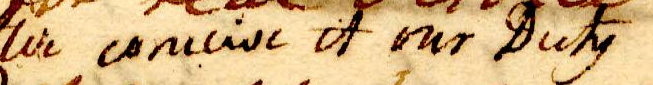We conceive it our Duty
